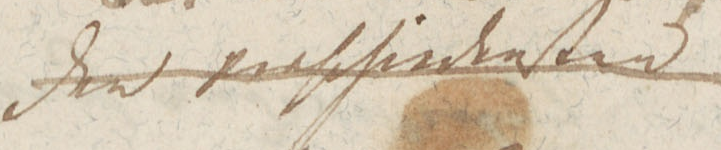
den verschiedensten
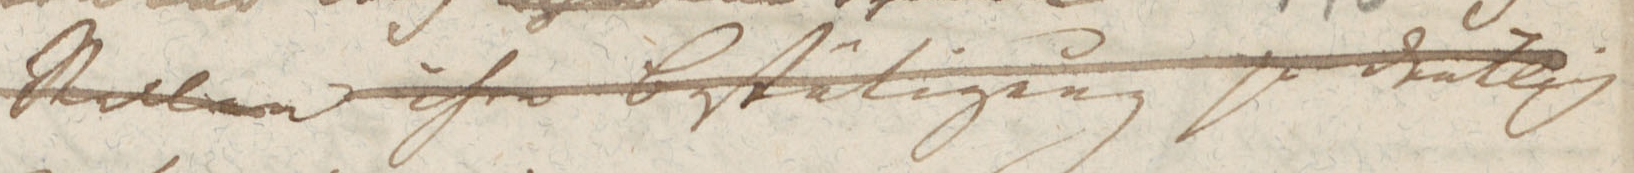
Stellen ihre Bestätigung so deutlich
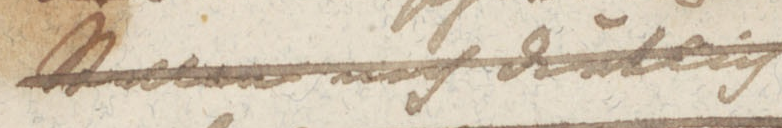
Stellen noch deutlich
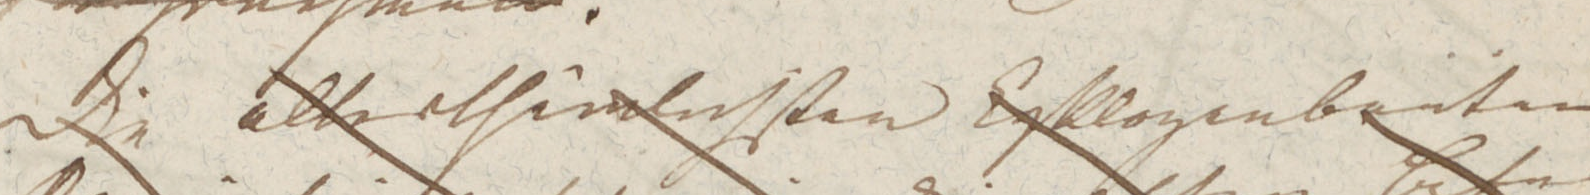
Die alterthümlichsten Cyklopenbauten
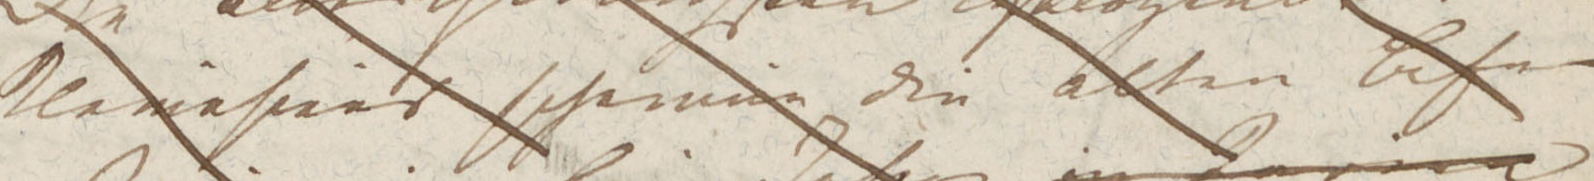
Kleinasiens scheinen die alten Befe-
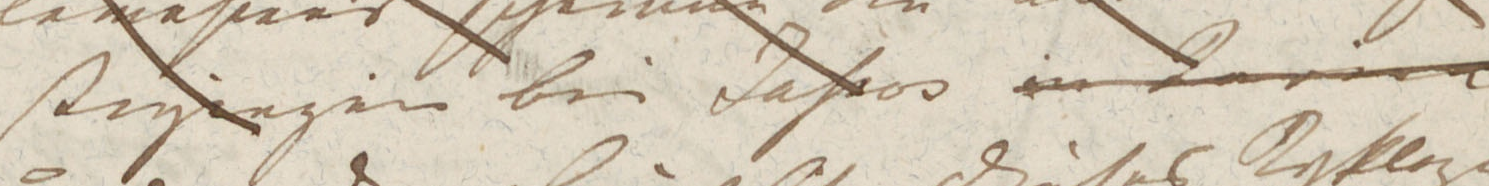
stigungen bei Jassos in Karien
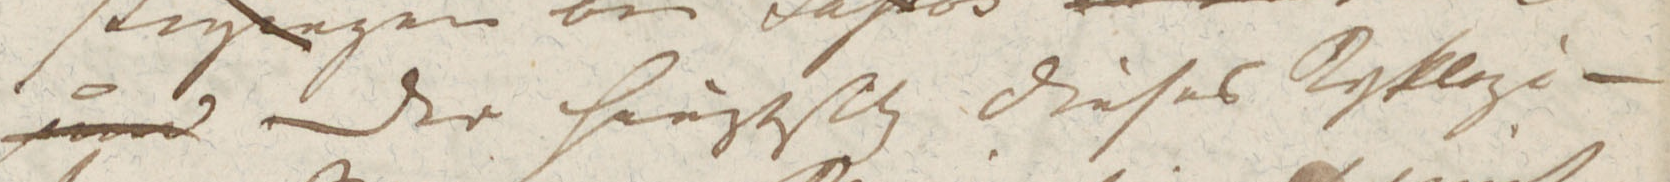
und Der Hauptsitz dieses Kyklopi-
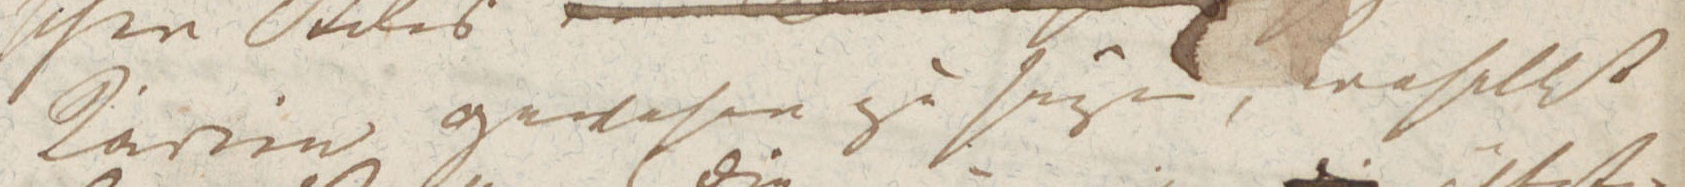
Karien gewesen zu seyn, woselbst
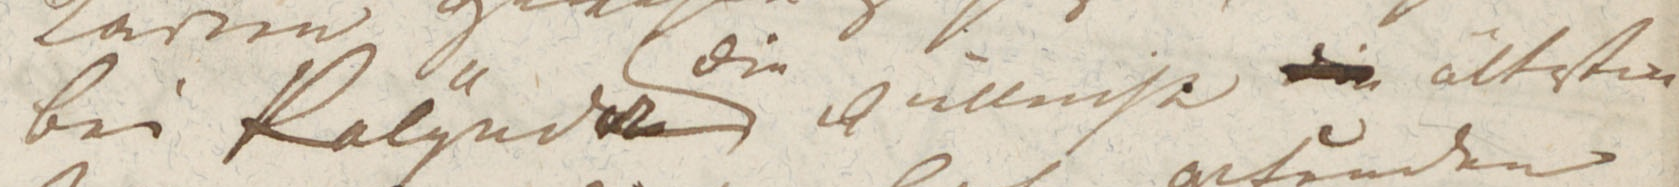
bei Kalynda die vielleicht die ältesten
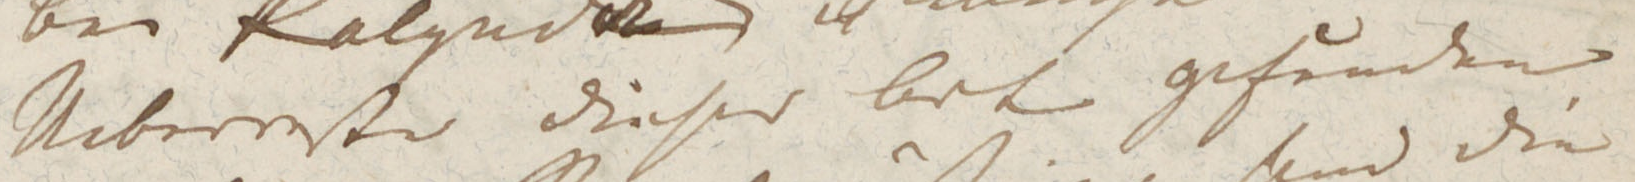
Ueberreste dieser Art gefunden
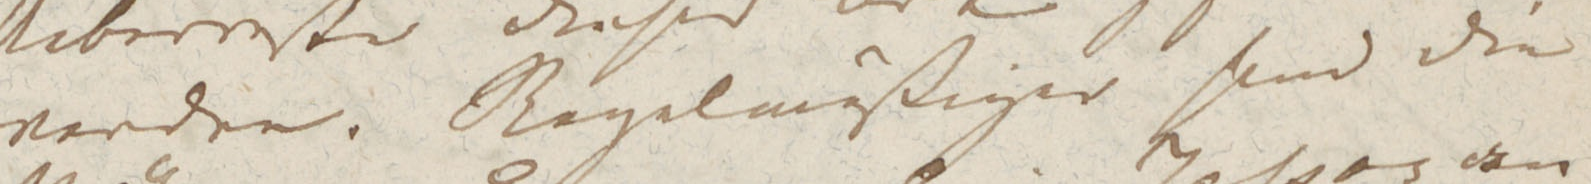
werden. Regelmässiger sind die
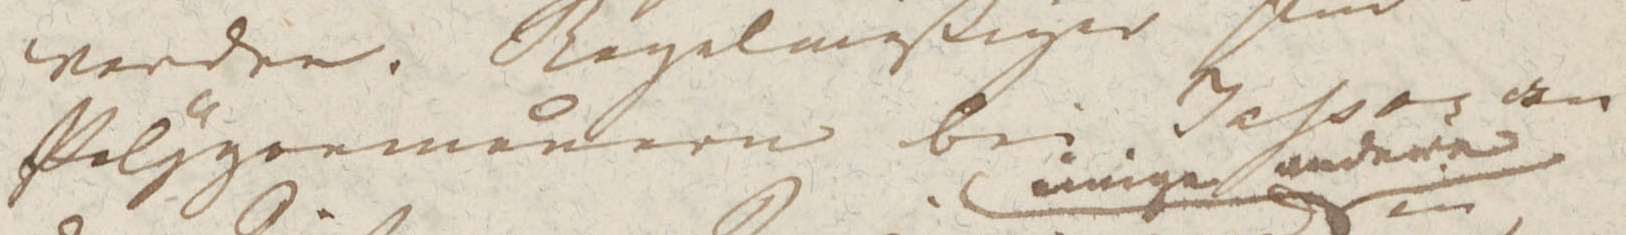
Polygonmauern bei Jassos an
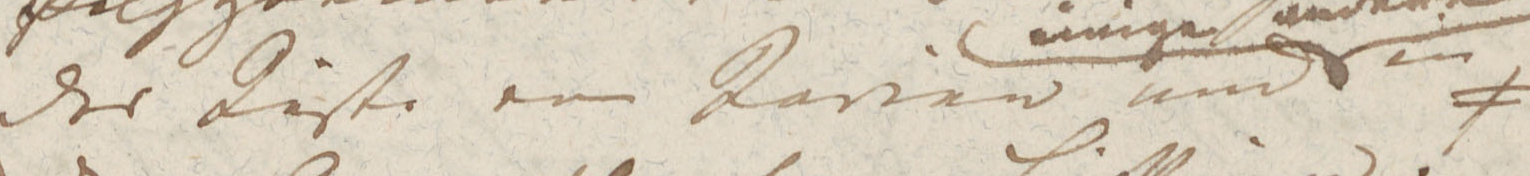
der Küste von Karien und einige andere in
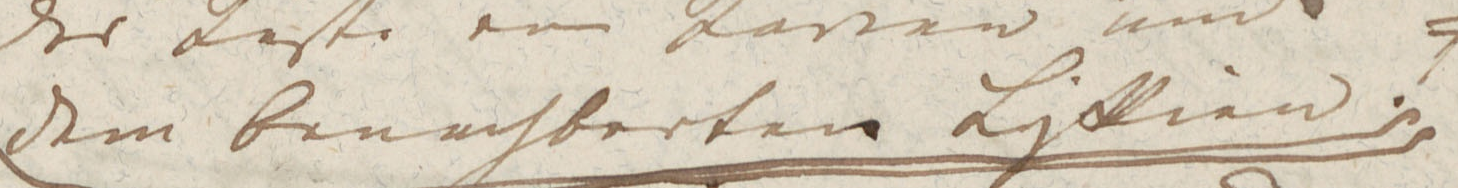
dem benachbarten Lykien. %
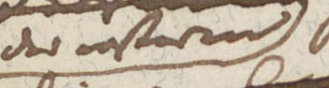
der merkwürdigsten
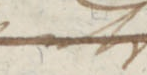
die in Gtien bereits
